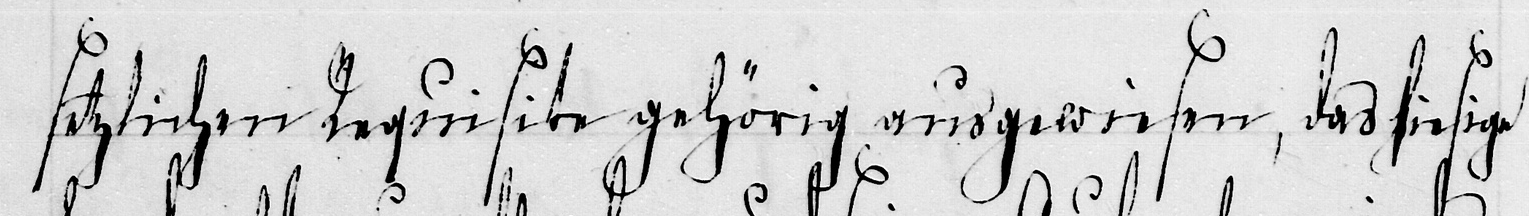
setzlichen Requisite gehörig ausgewiesen, das hiesi¬
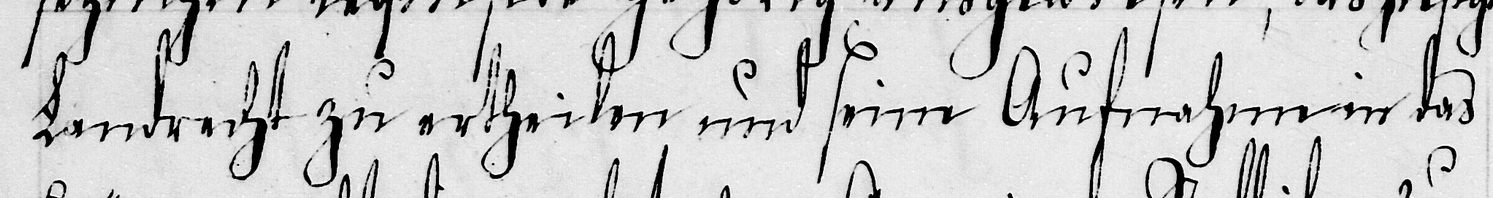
Landrecht zu ertheilen und seine Aufnahme in das
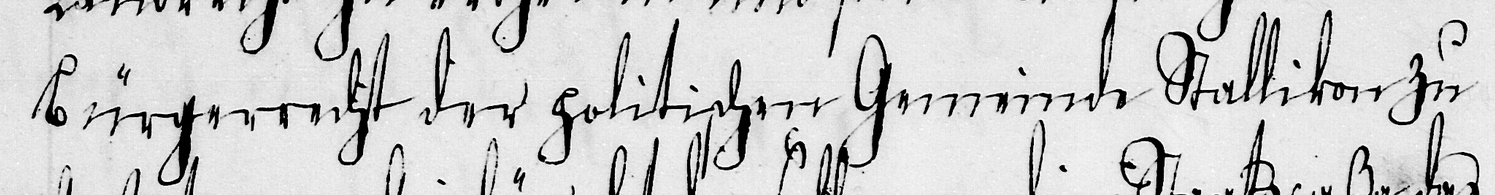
Bürgerrecht der politischen Gemeinde Stallikon zu
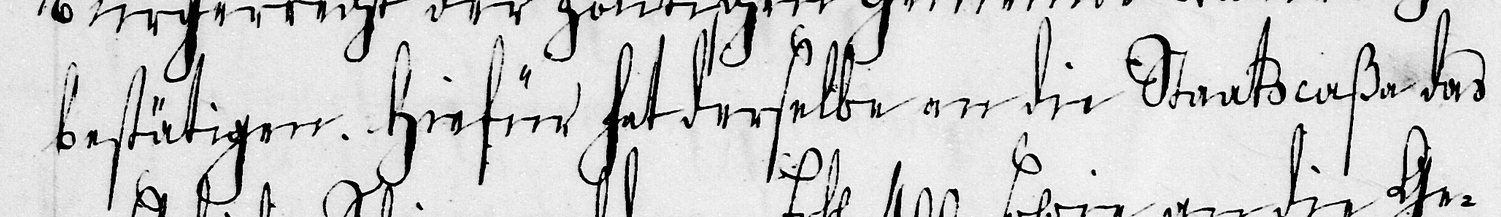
bestätigen. Hiefür hat derselbe an die Staatscaßa das
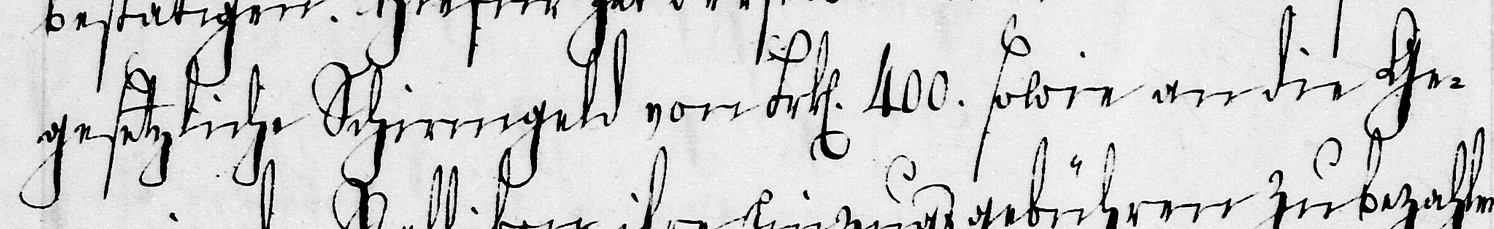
gesetzliche Schirmgeld von Frk[en]. 400. sowie an die Ge¬
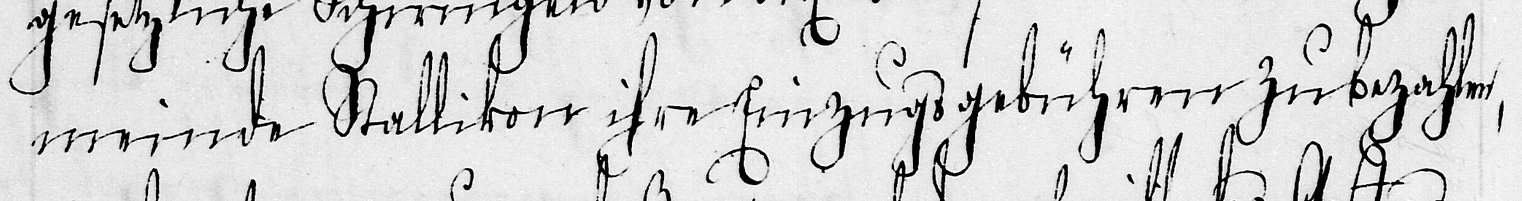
meinde Stallikon ihre Einzugsgebühren zu bezahlen,
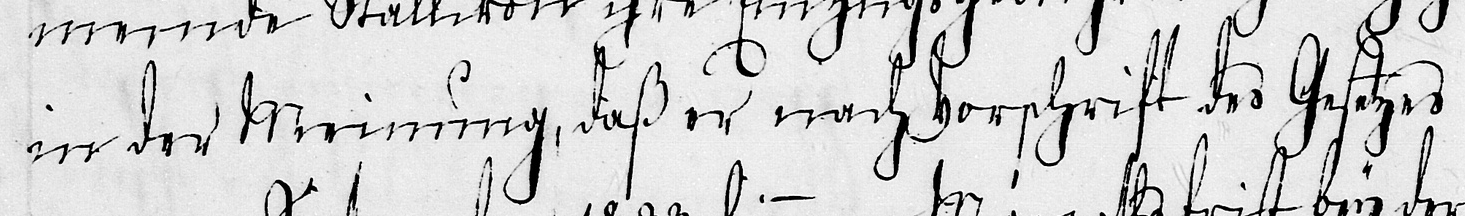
in der Meinung, daß er nach Vorschrift des Gesetzes
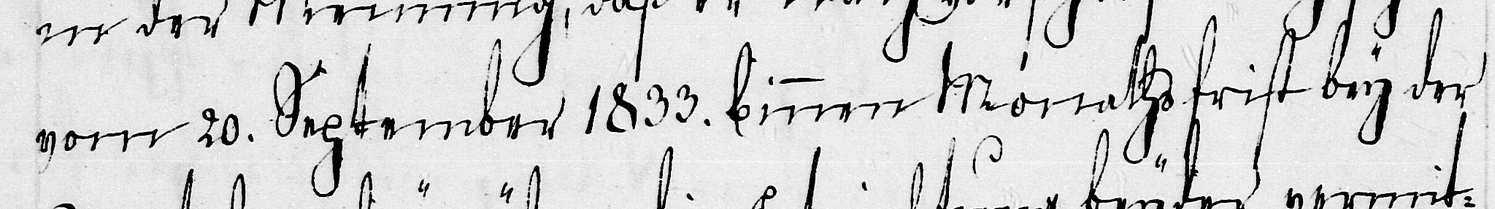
vom 20. September 1833. binnen Monathsfrist bey der
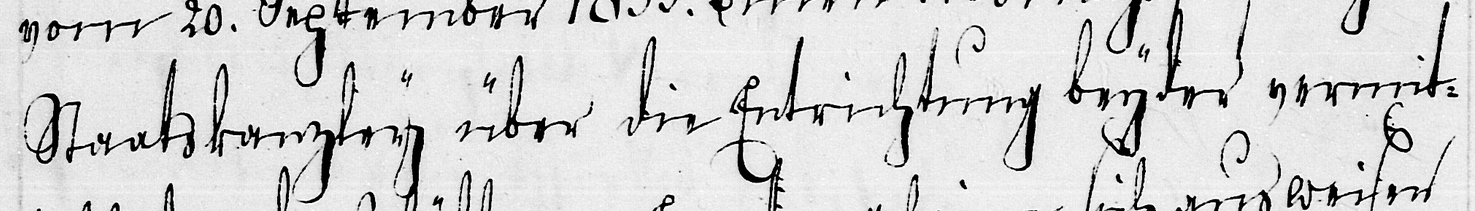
Staatskanzley über die Entrichtung beyder vermit¬
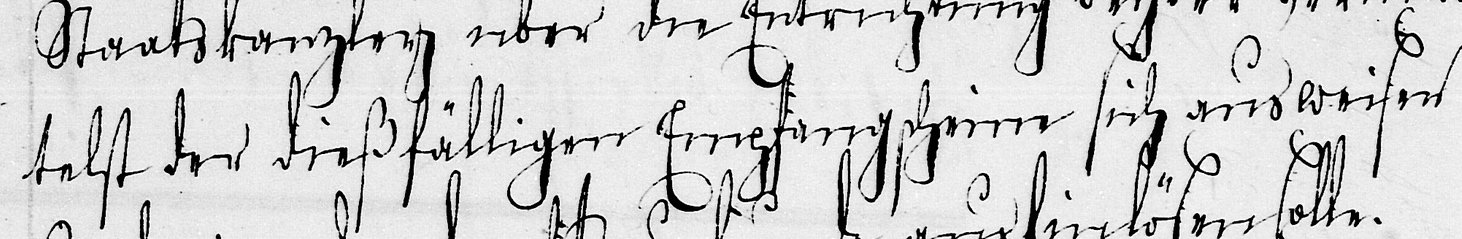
telst der dießfälligen Empfangscheine sich ausweisen
